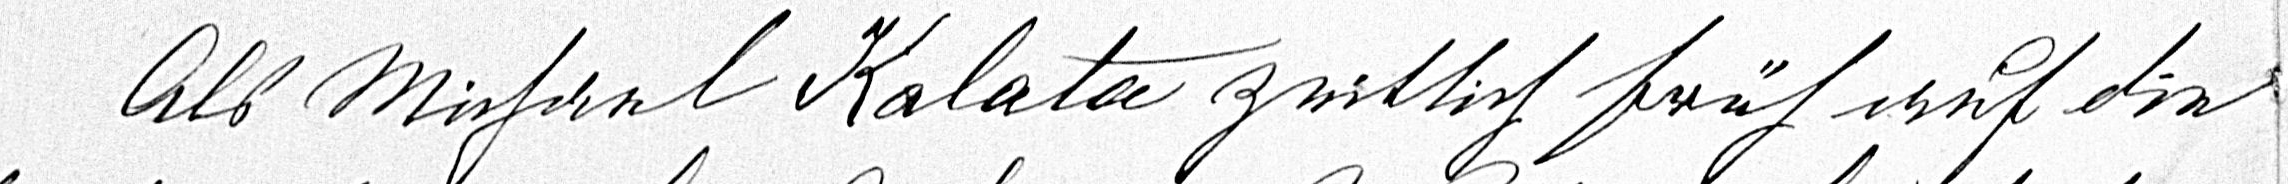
Als Michael Kalata zeitlich früh auf die
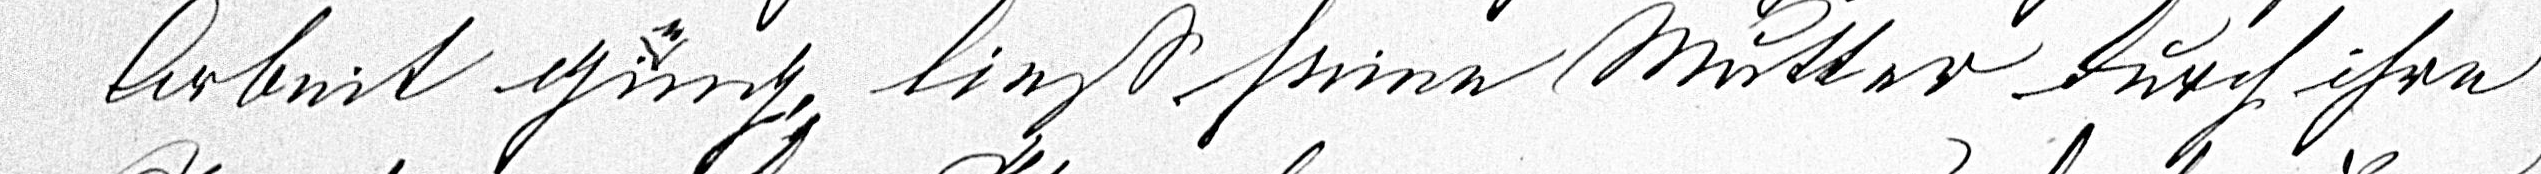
Arbeit ging, ließ seine Mutter durch ihre
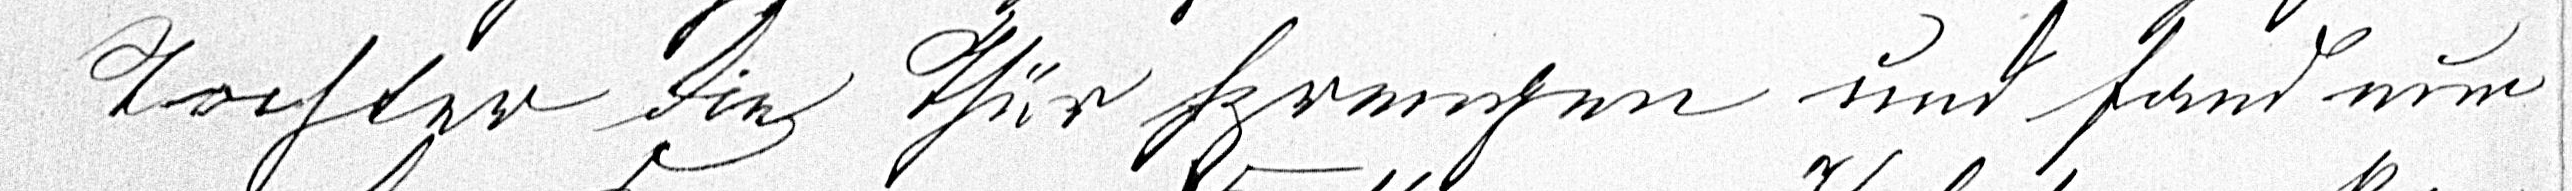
Tochter die Thür sprengen und fand nun
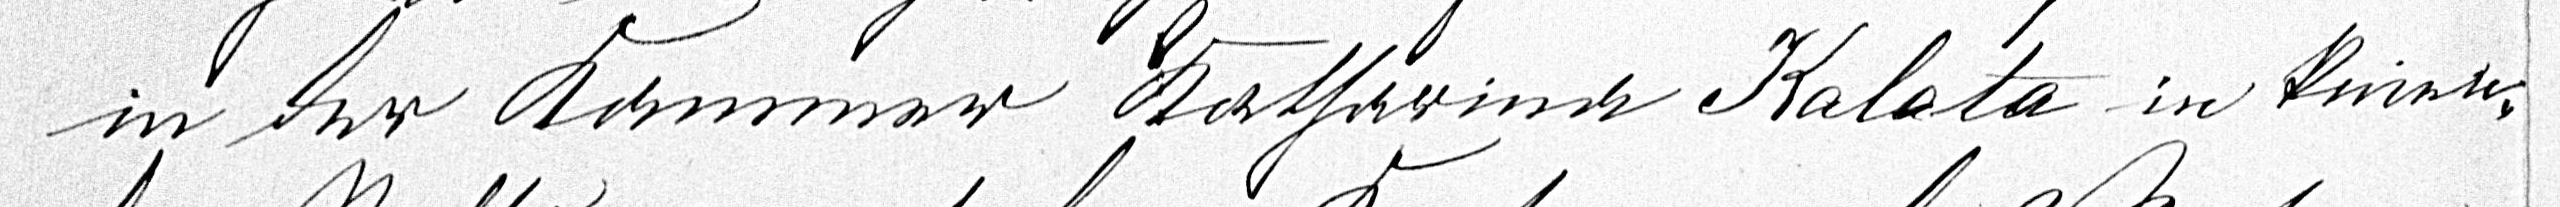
in der Kammer Katharina Kalata in keine-
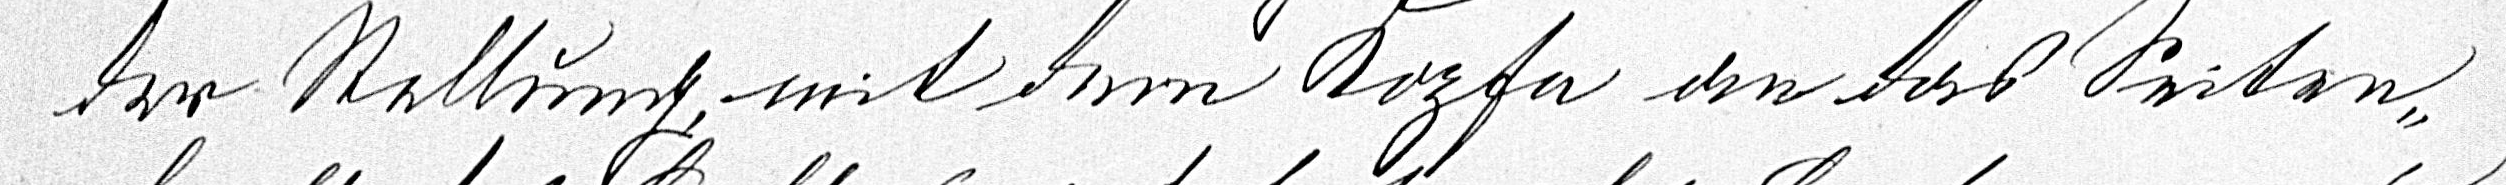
der Stellung, mit dem Kopfe an das Seiten¬
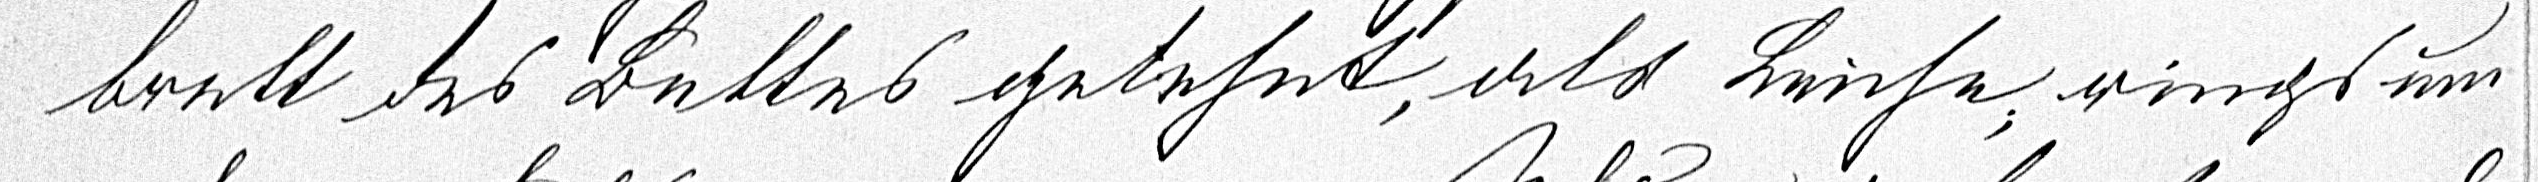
brett des Bettes gelehnt, als Leiche; rings um
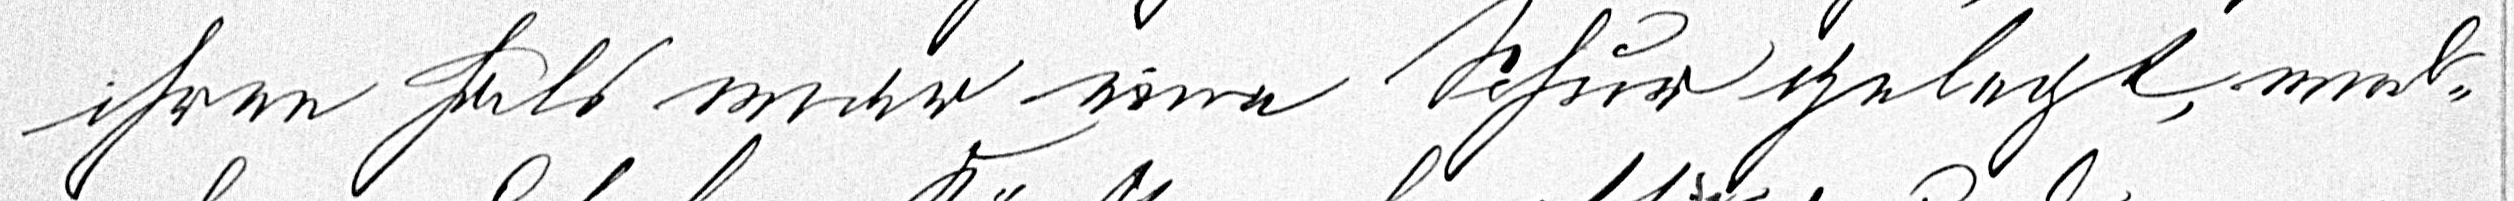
ihren Hals war eine Schur gelegt, wel¬
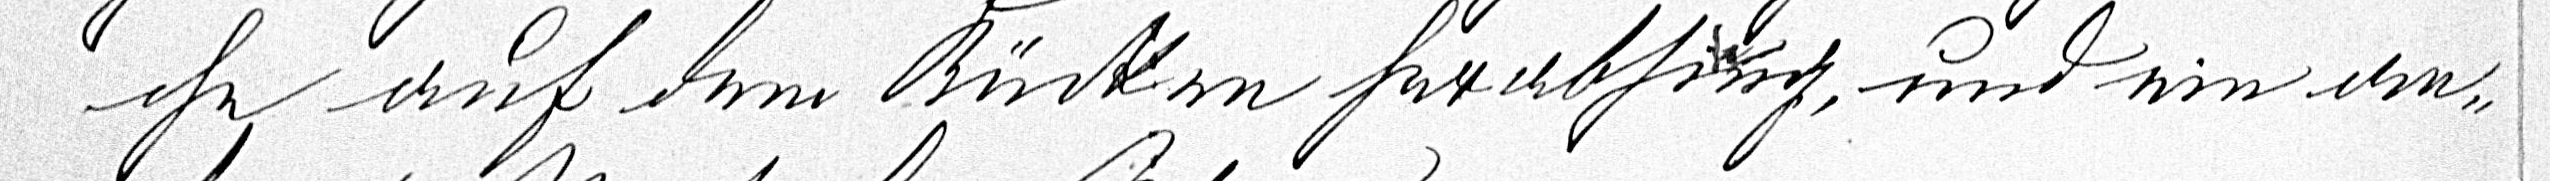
che auf dem Rücken herabhing, und ein an¬
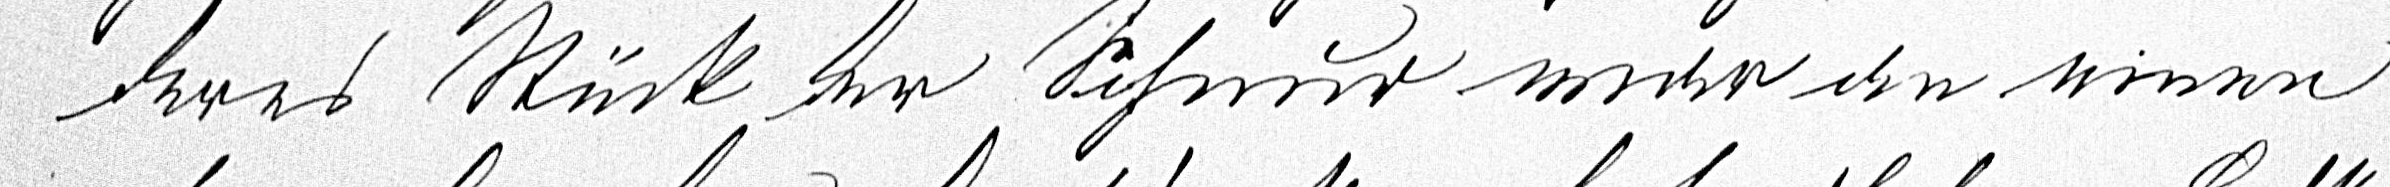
deres Stück der Schnur war an einen
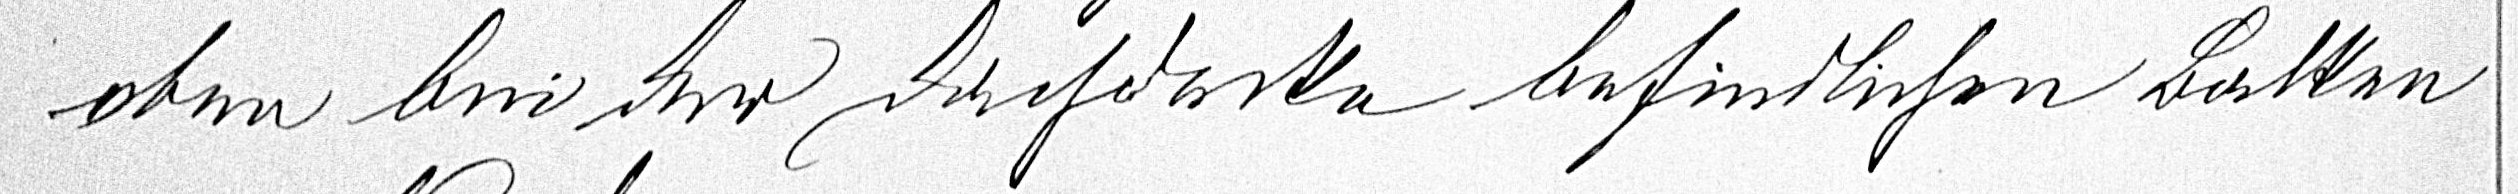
oben bei der Dachdecke befindlichen Balken
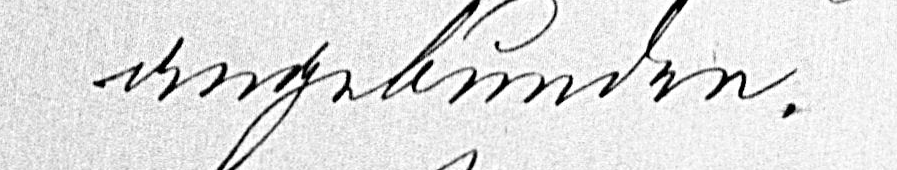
angebunden.
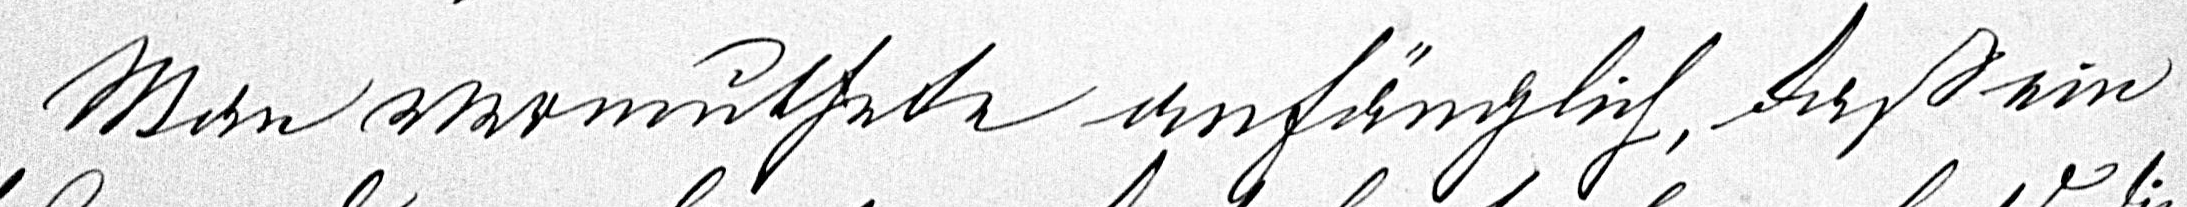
Man vermuthete anhänglich, daß ein
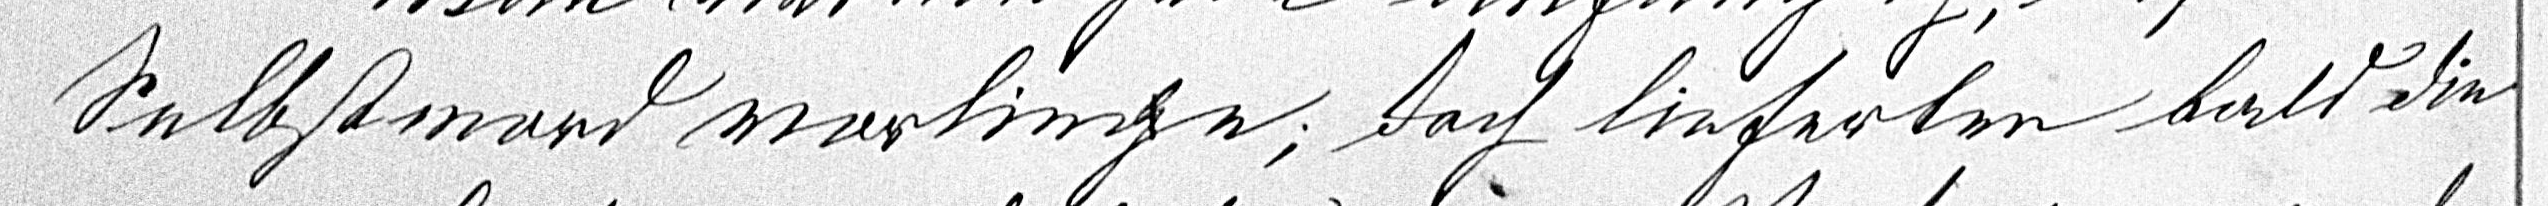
Selbstmord vorliege, doch lieferten bald die
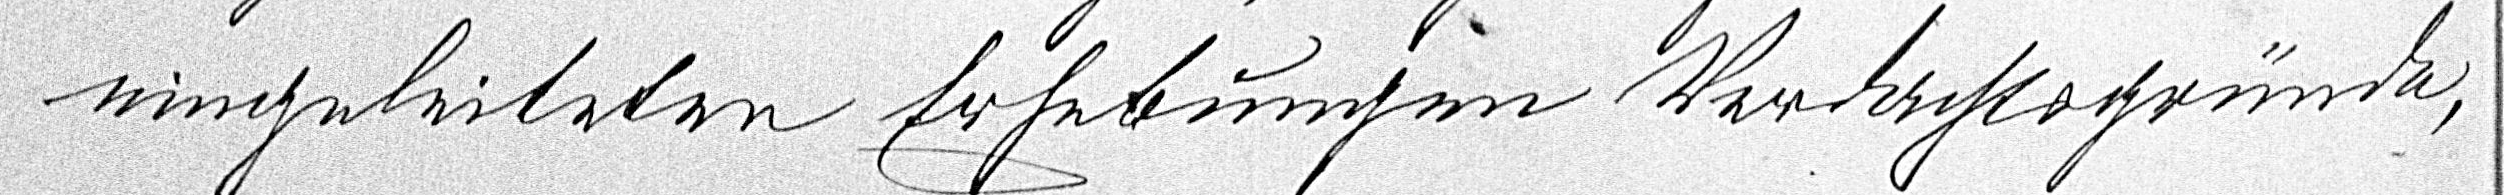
eingeleiteten Erhebungen Verdachtsgründe,
